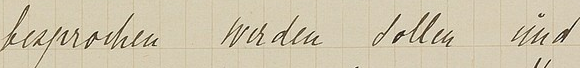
besprochen werden sollen und
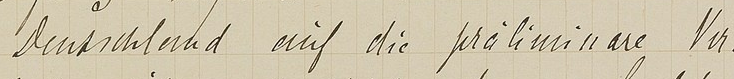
Deutschland auf die präliminare Ver-
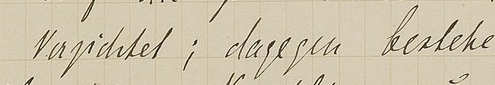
verzichtet; dagegen bestehe
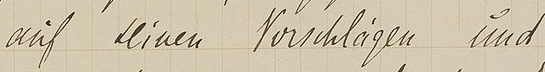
auf seinen Vorschlägen und
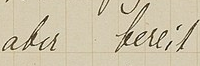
aber bereit an
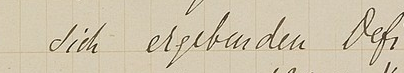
sich ergebenden Defi-
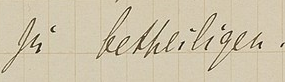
zu betheiligen.
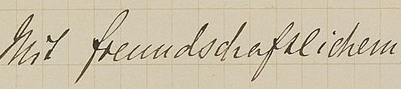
Mit freundschaftlichem
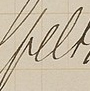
Welti
